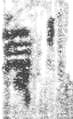不
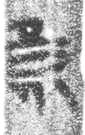福
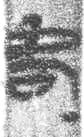唬（嘑）
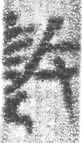○（愷）
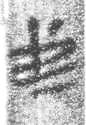弟
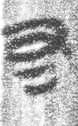君
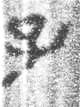子
